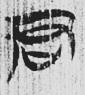君
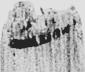亡
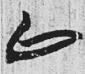㠯
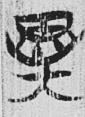異
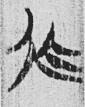於
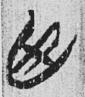臣
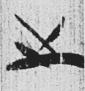之
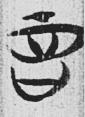言
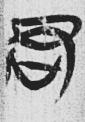君
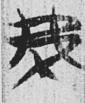弗
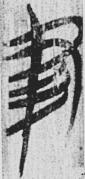○（盡）
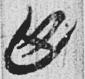臣
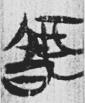○（聞）
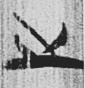之
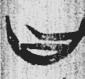曰
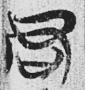君
